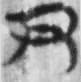尹
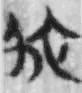{力它}
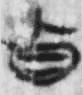貞
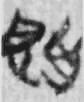既
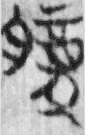腹
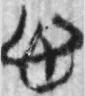心
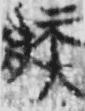疾
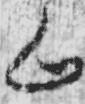㠯（以）
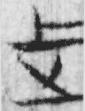上B
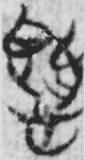○（氣）
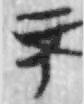不
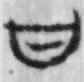甘
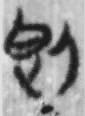○（食）
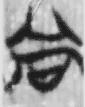尚
